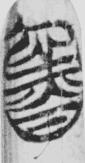魯
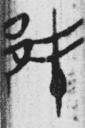邦
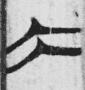大
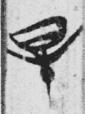旱
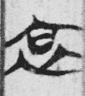哀
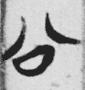公
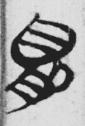{胃刀}（謂）
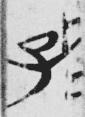孔子
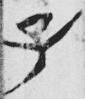子
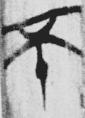不
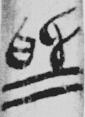爲
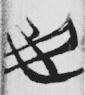我
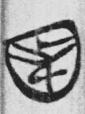○（圖）
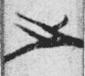之
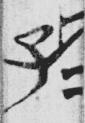孔子
